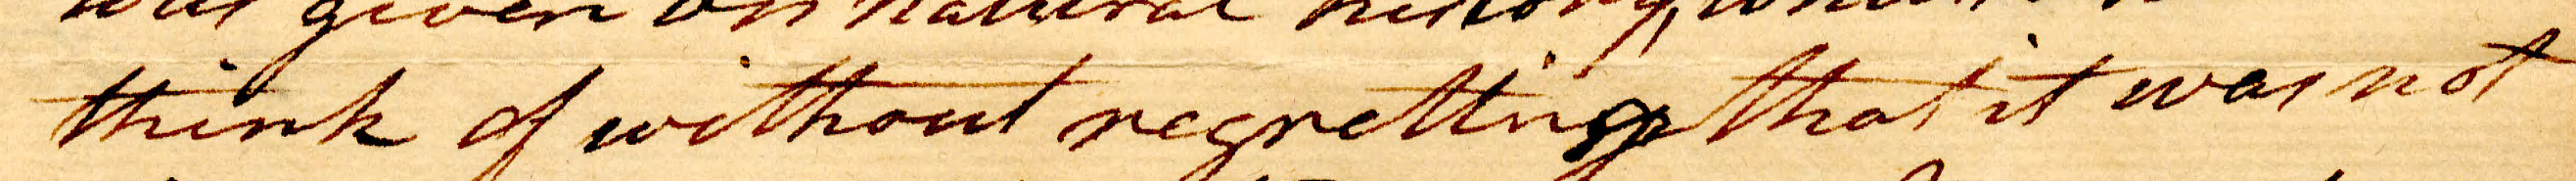think of without regretting that it was not
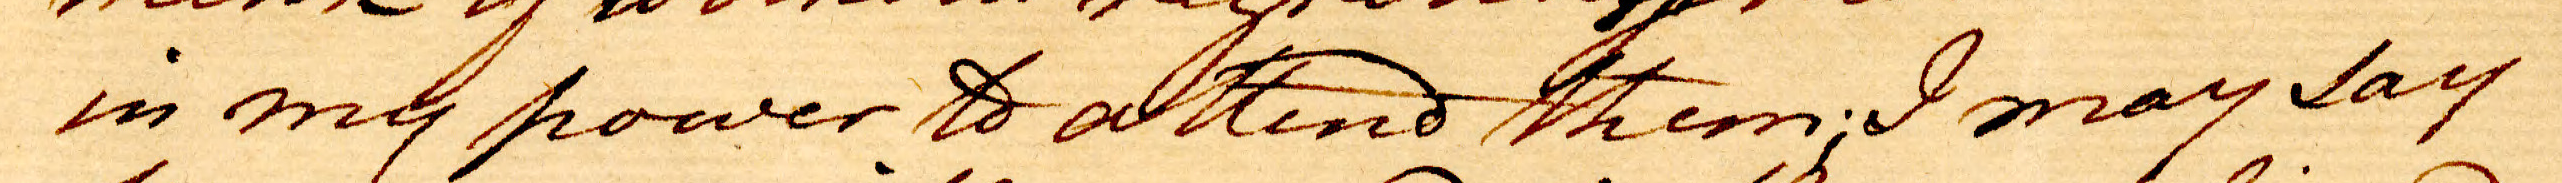in my power to attend them; I may say
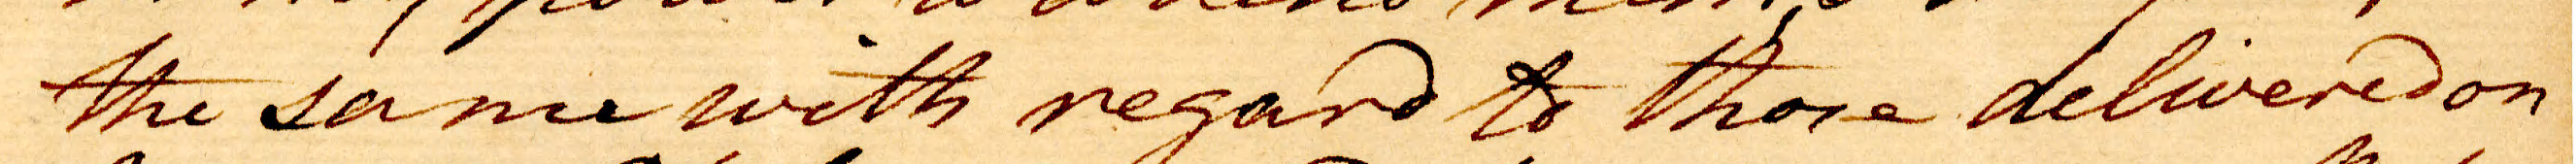the same with regard to those delivered on
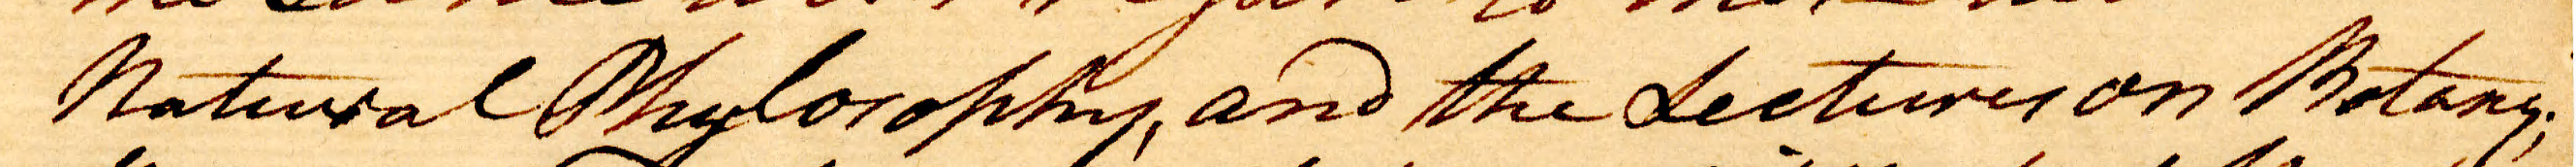Natural Phylosophy, and the Lectures on Botany;
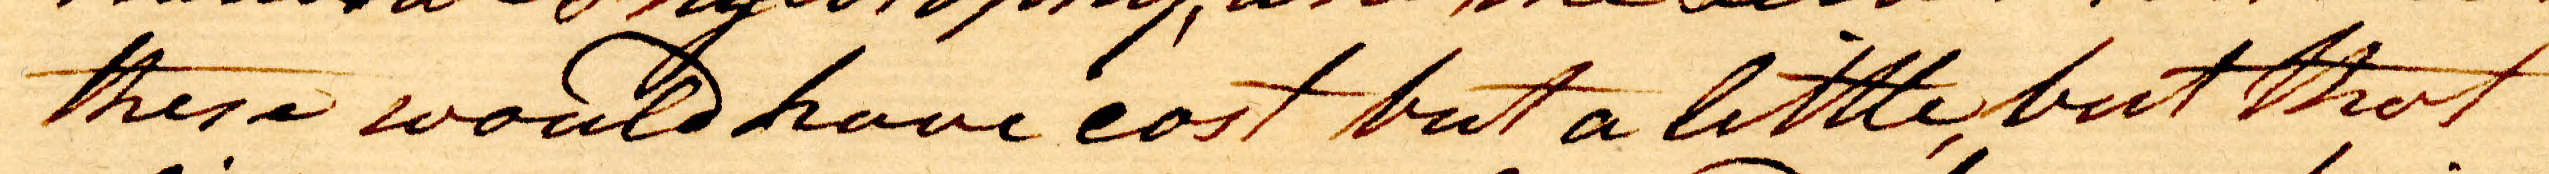these would have cost but a little, but that
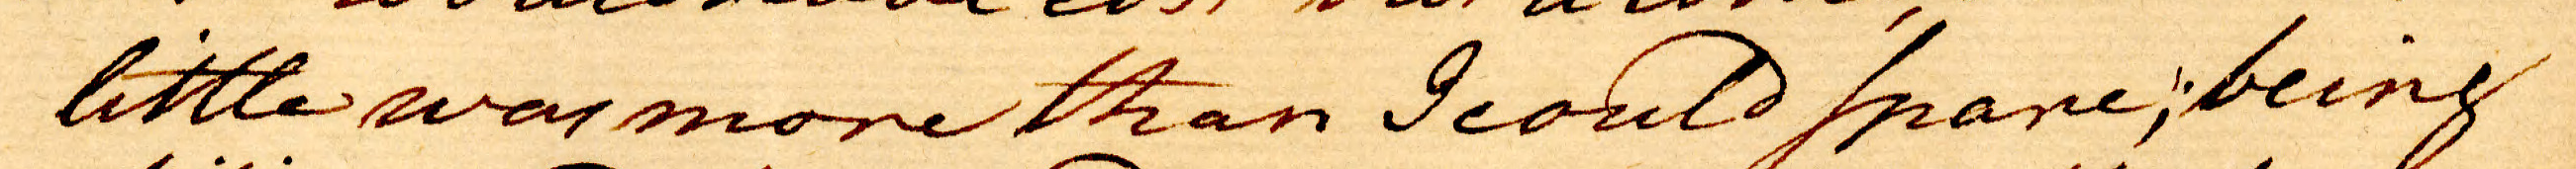little was more than I could spare; being
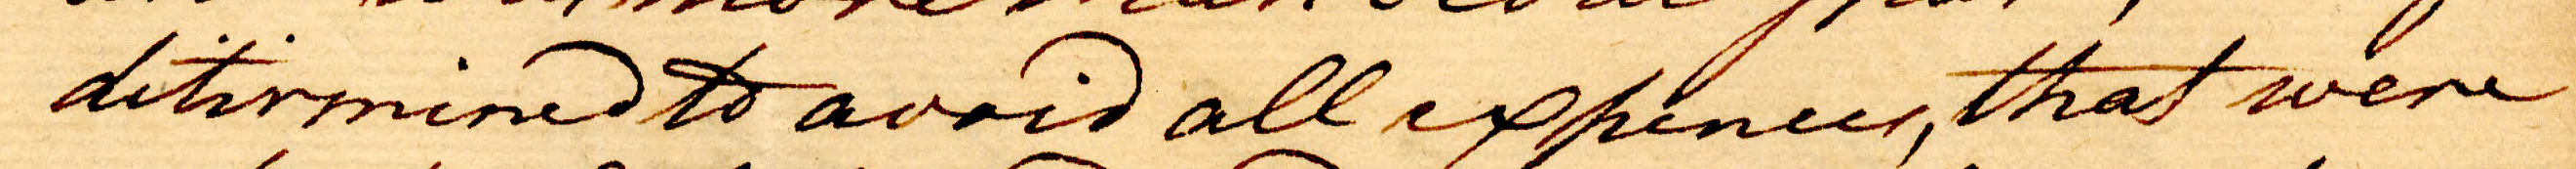ditirmined to avoid all expences, that were
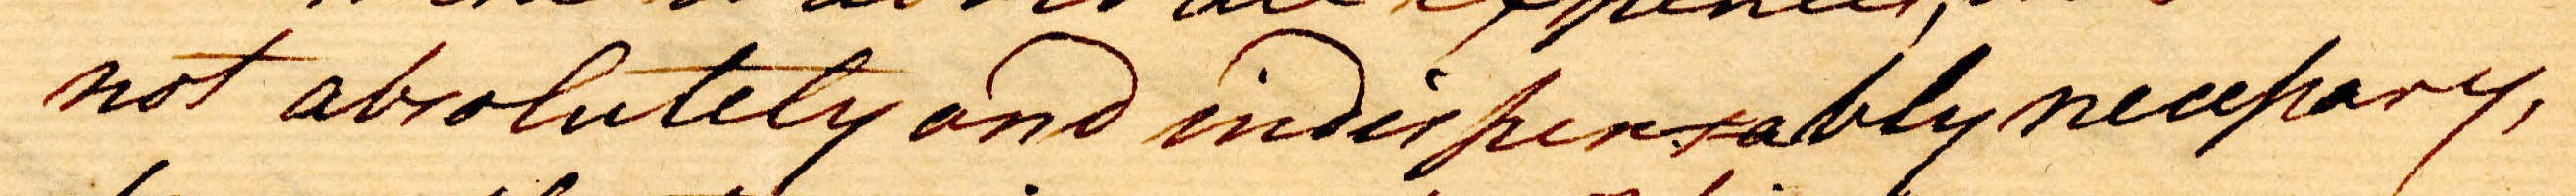not absolutely and indispensably necessary,
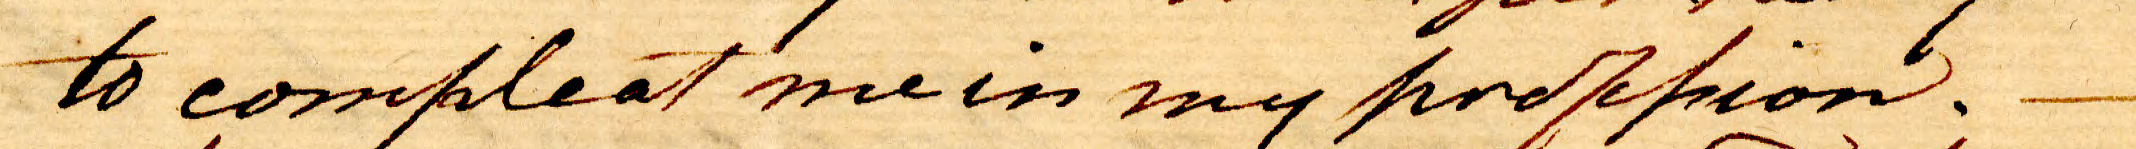to compleat me in my profession.-
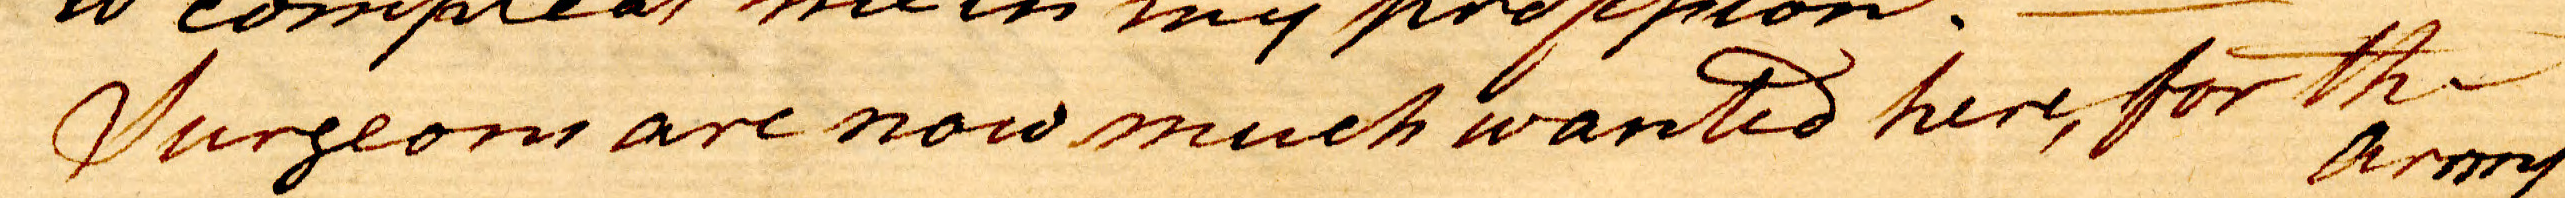Surgeons are now much wanted here, for the
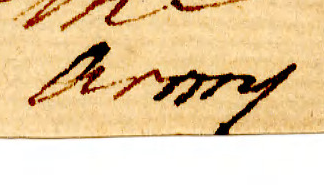army
